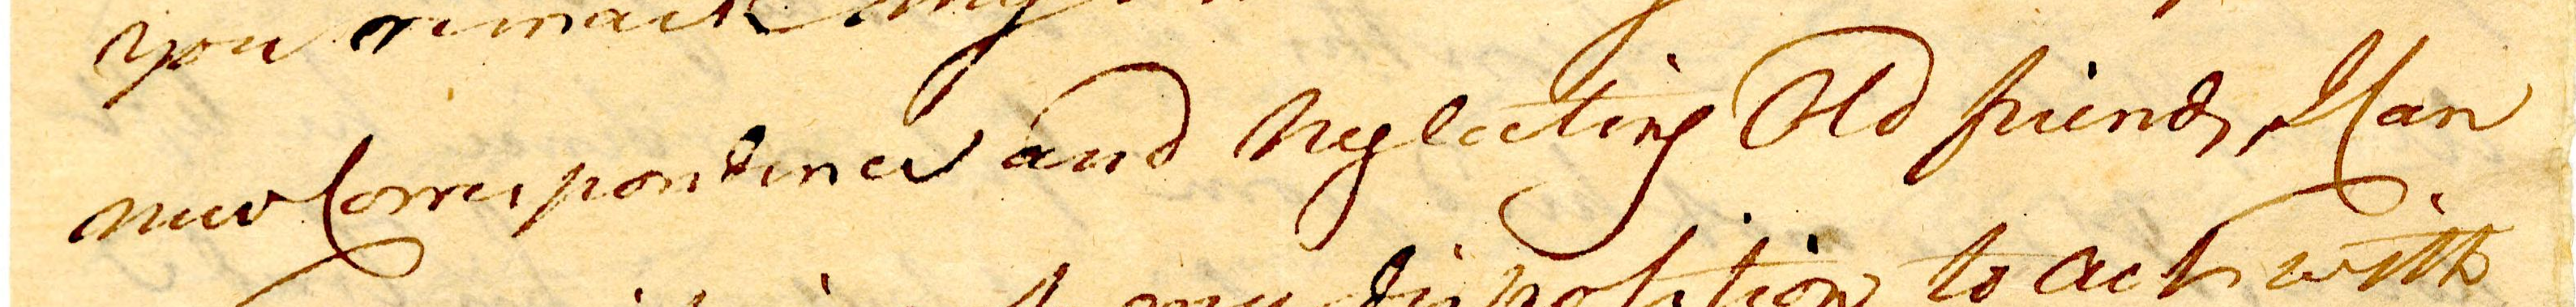new Correspondences and neglecting Old friends, & can
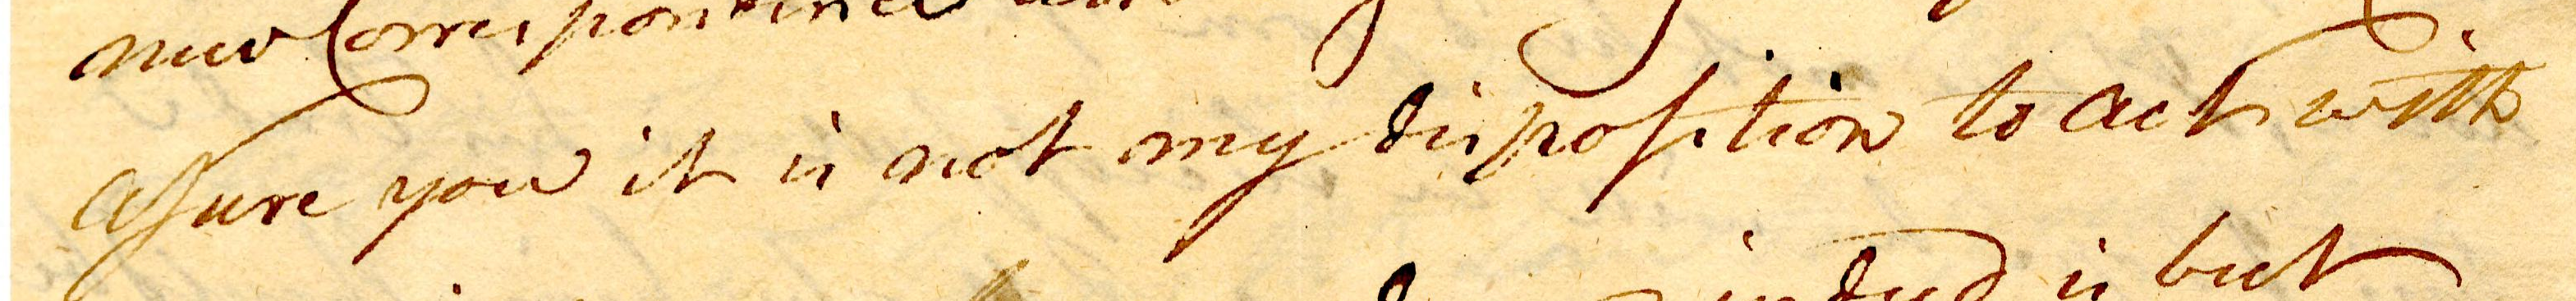asure you it is not my disposition to act with
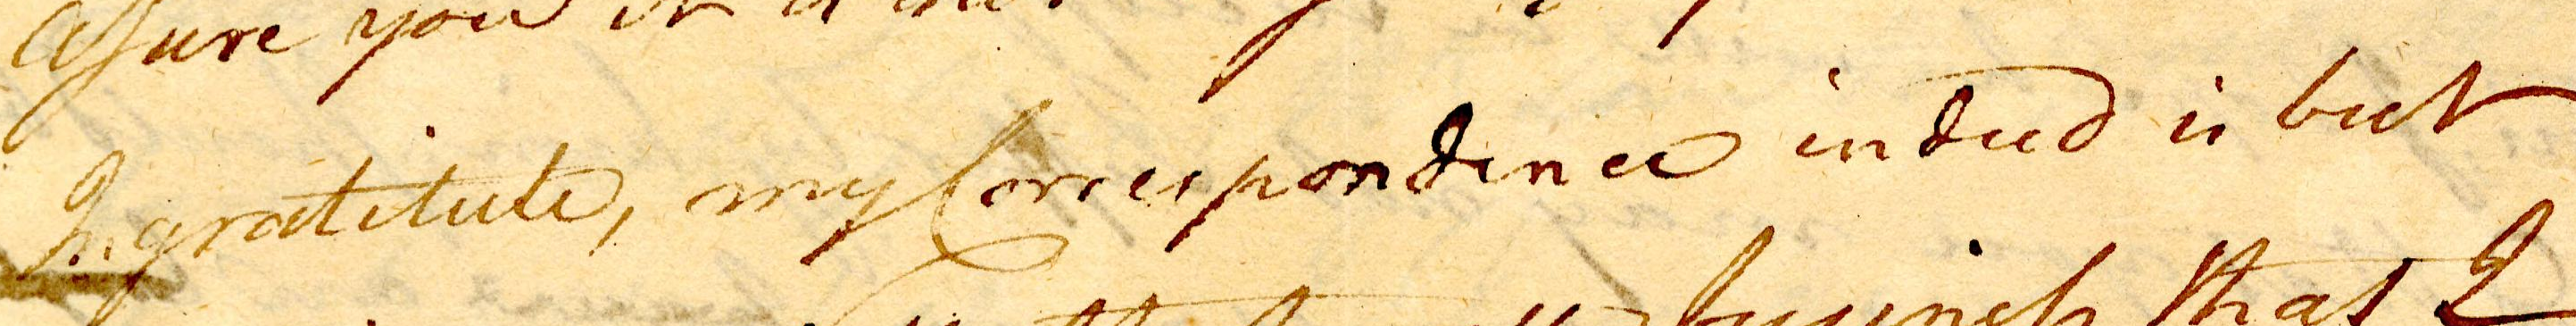Ingratitute, my Correspondence indeed is but
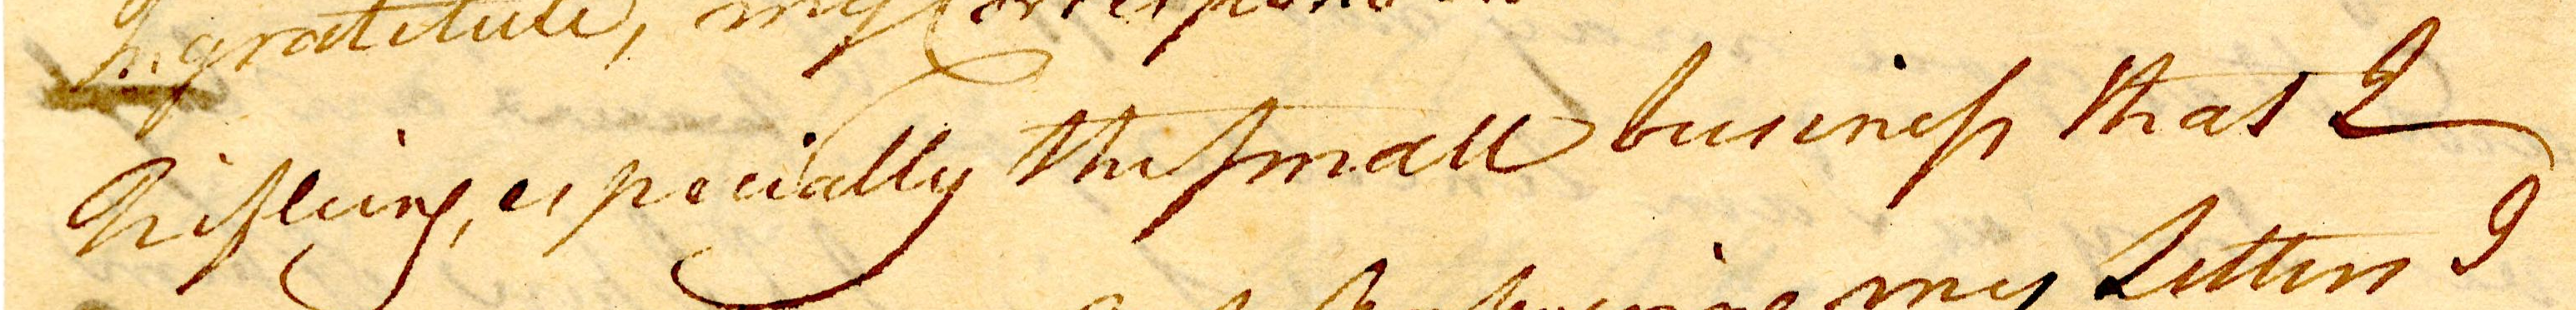trifling, especially the small business that I
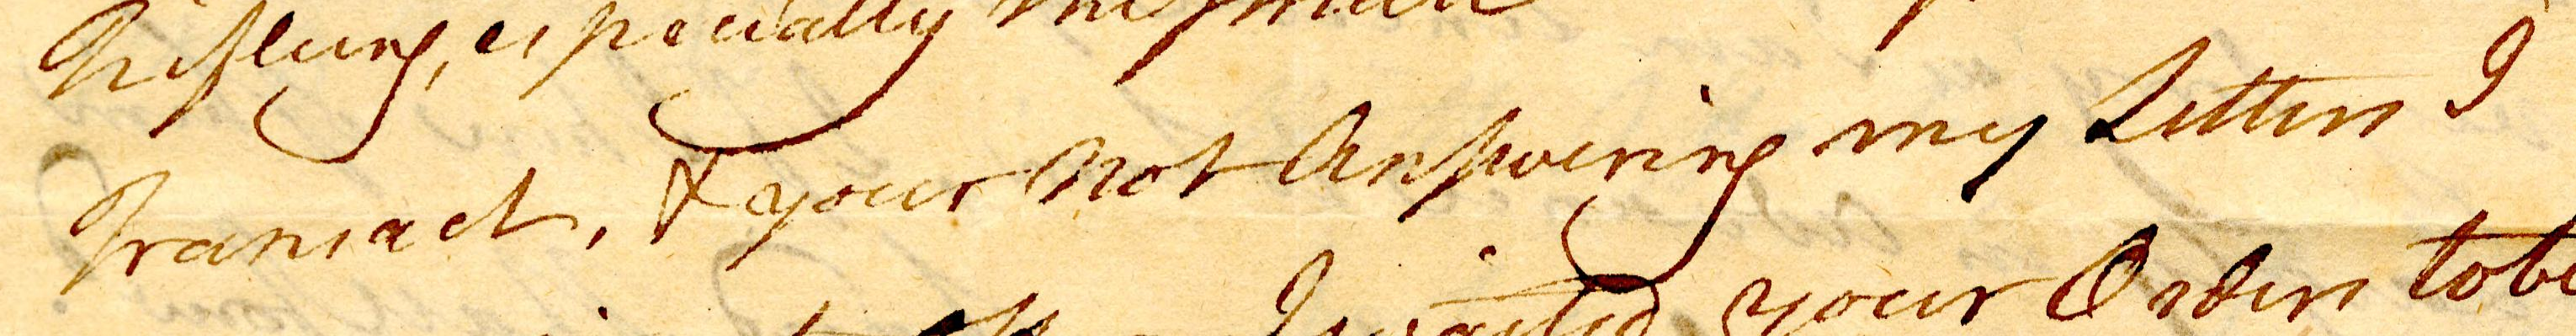Transact, & your not Answering my Letters I
